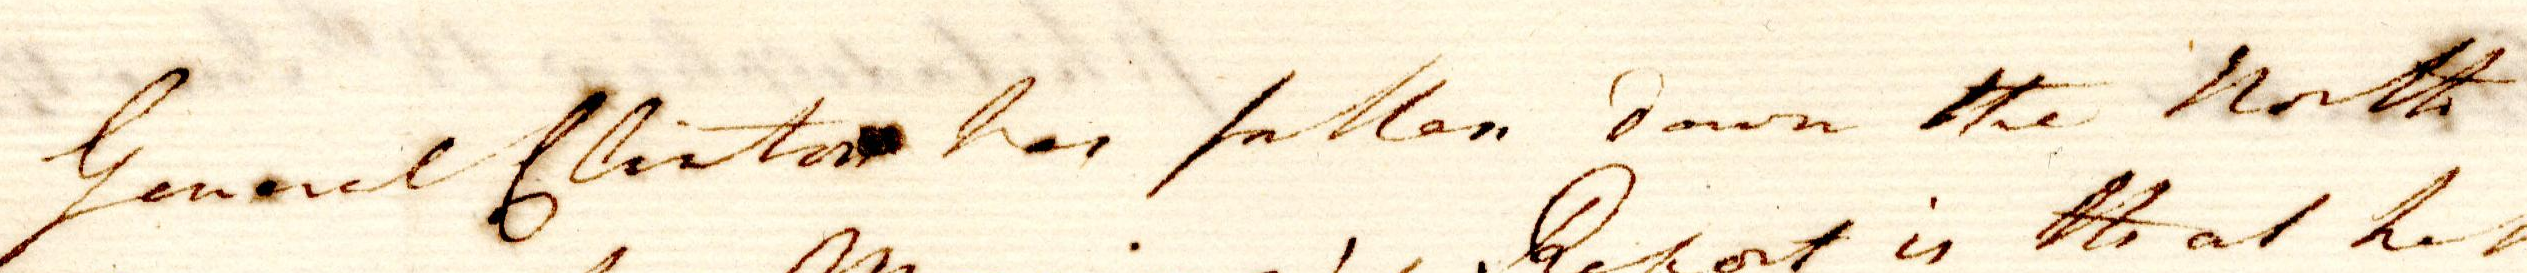General Clinton has fallen down the North
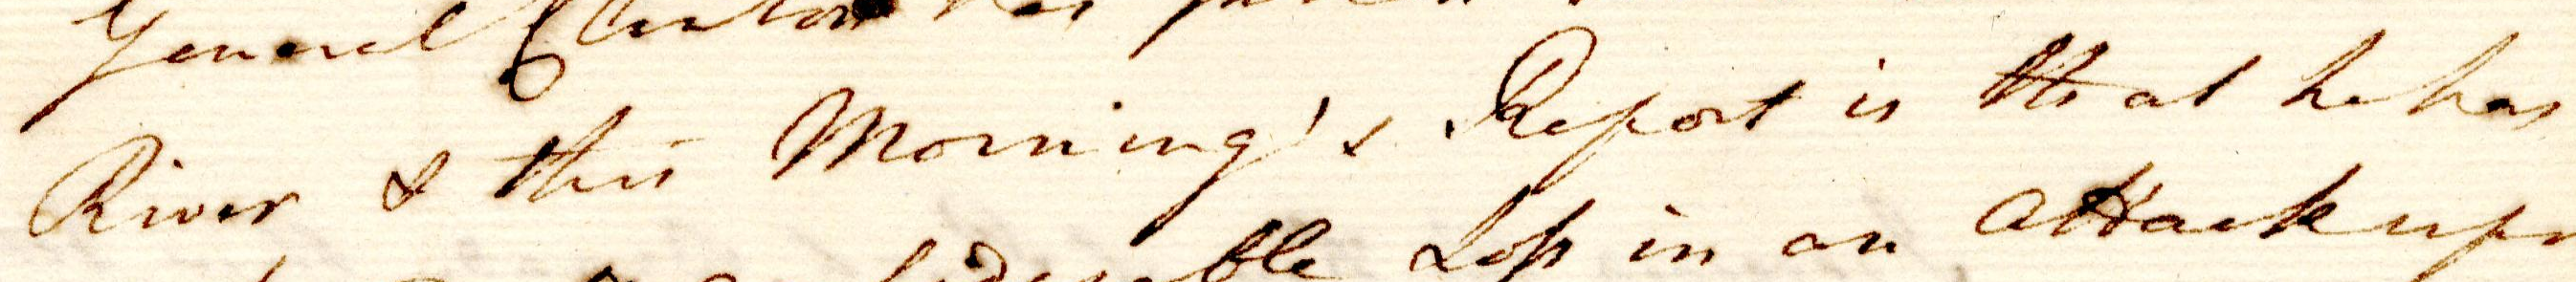River & this Morning's Report is that he has
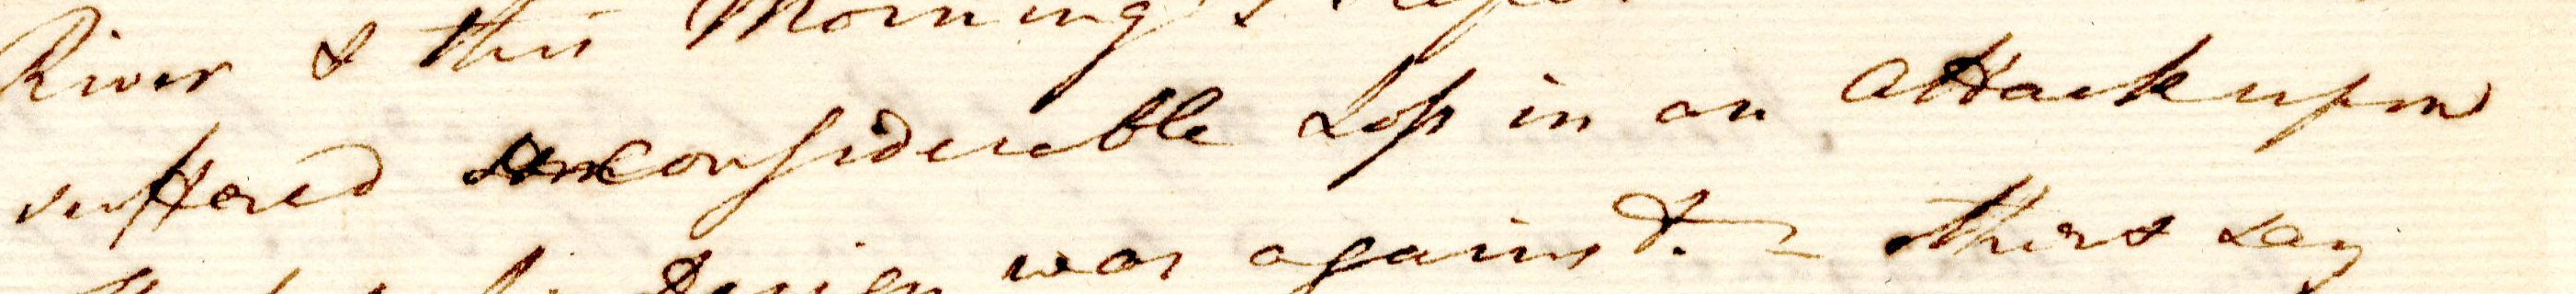suffered Considerable Loss in an Attack upon
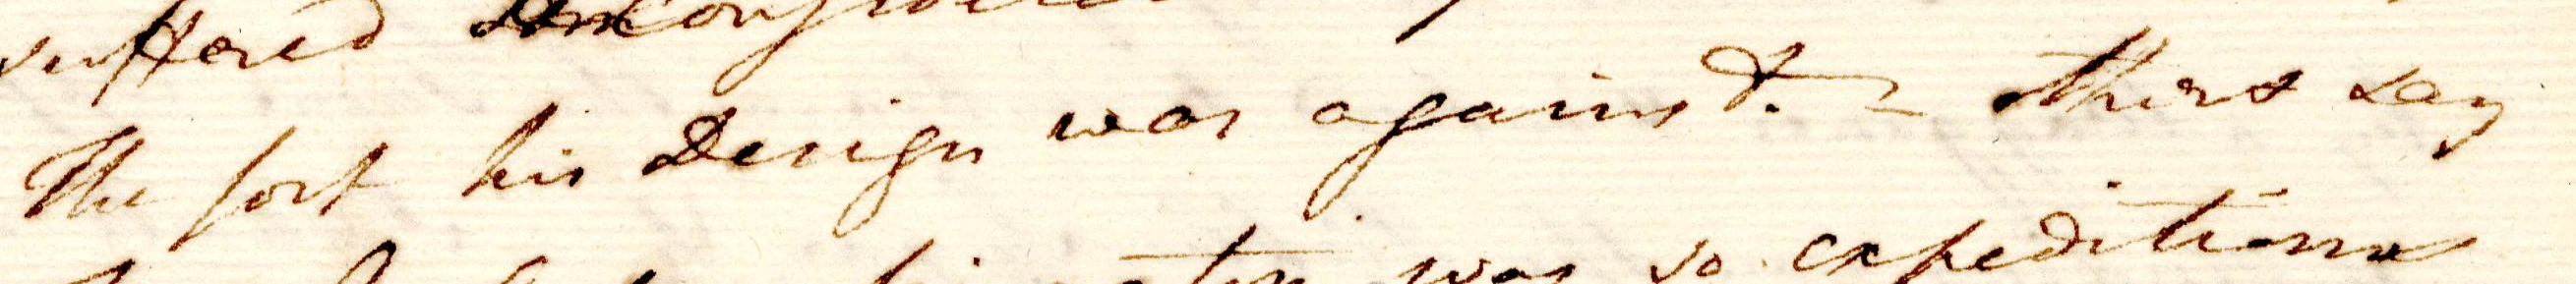the fort his Design was against. others say
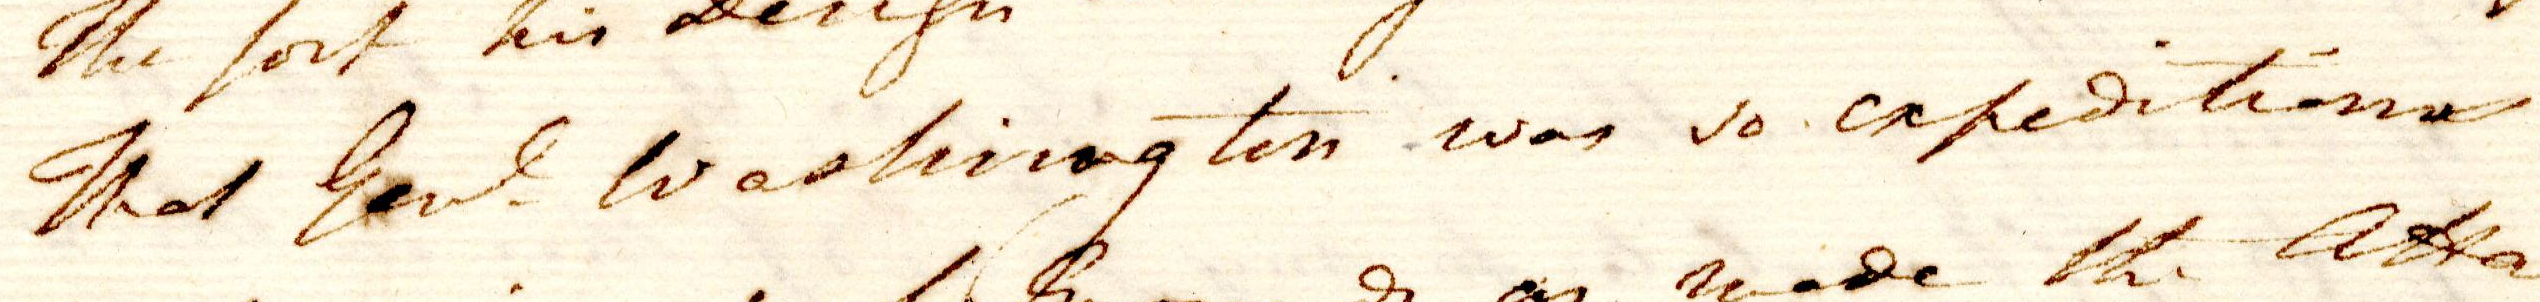That Gen^l. Washington was so expeditious
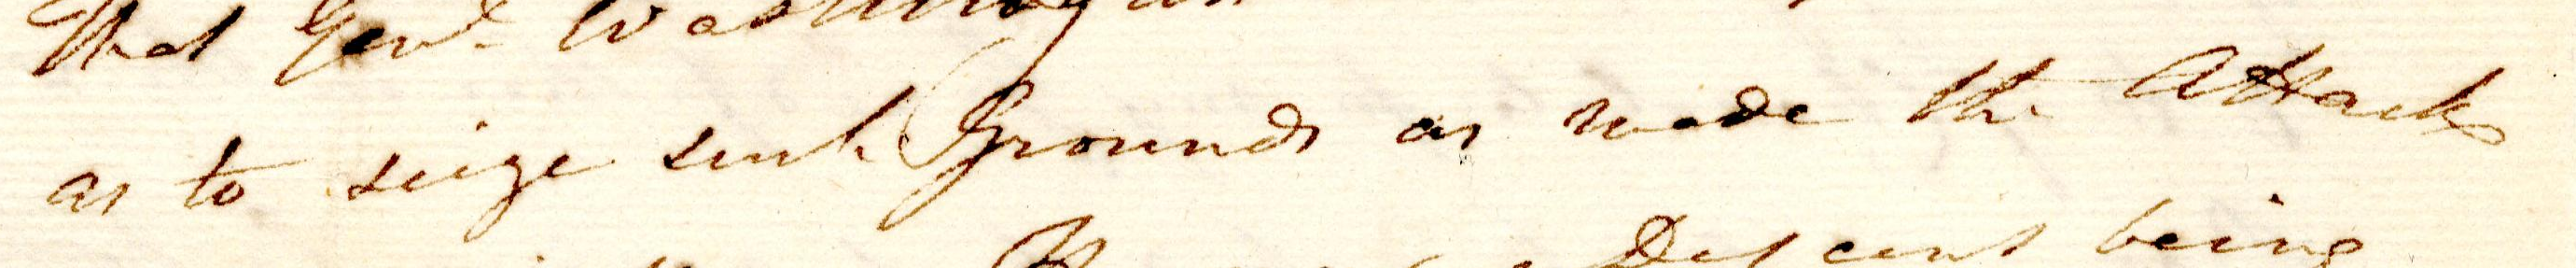as to seize such Grounds as made the Attack
